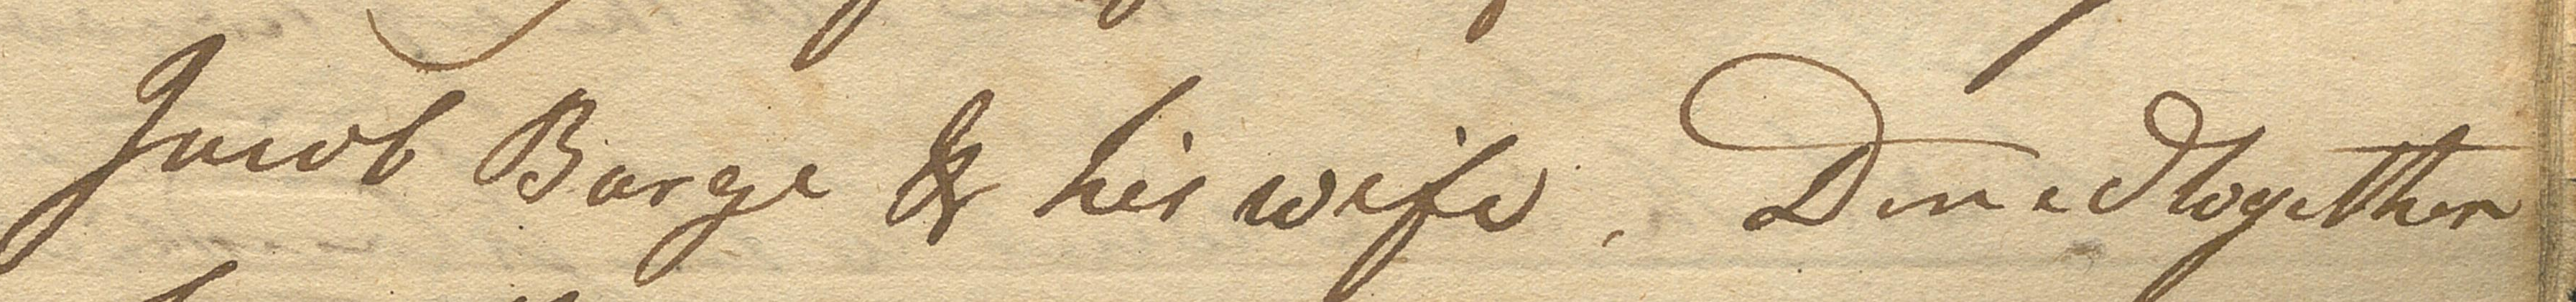Jacob Barge & his wife, Dined together
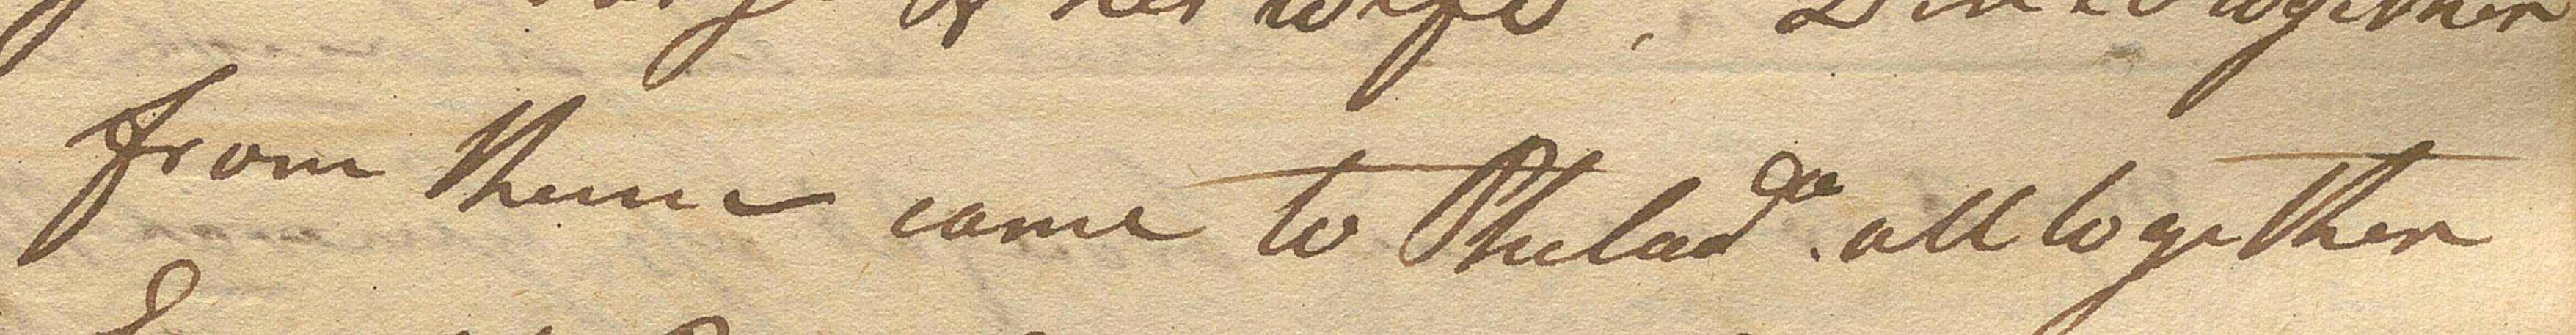from thence came to Philad^a. all l\together
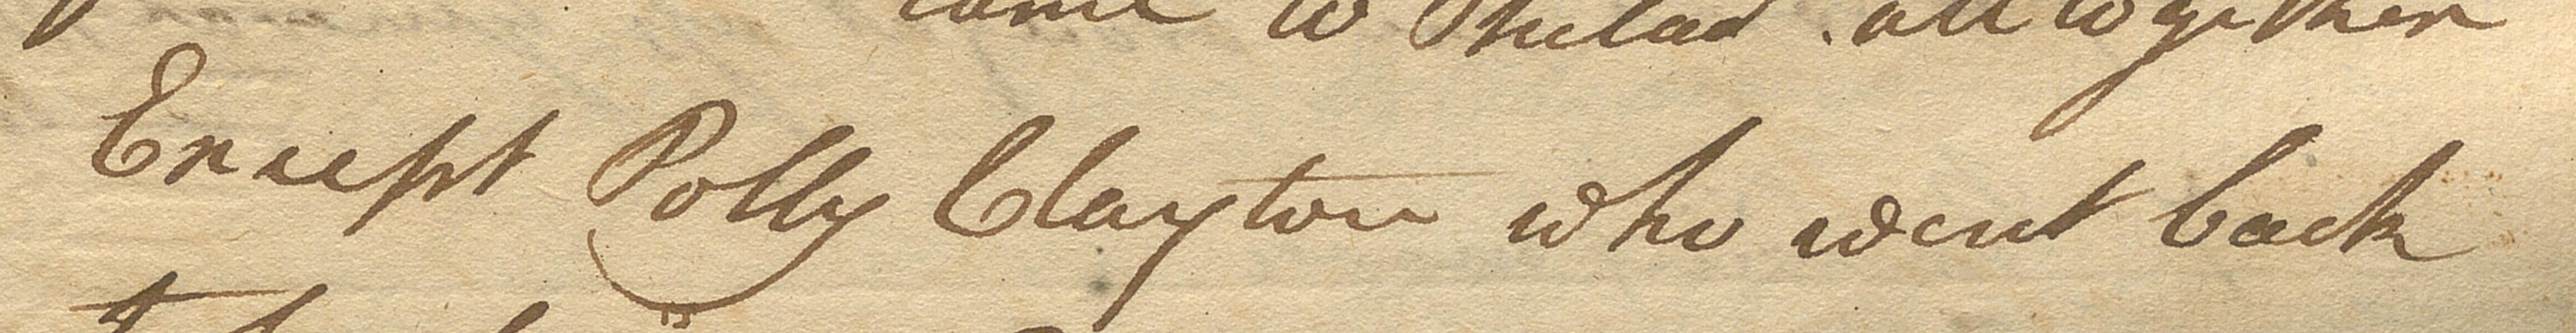Except Polly Clayton who went back
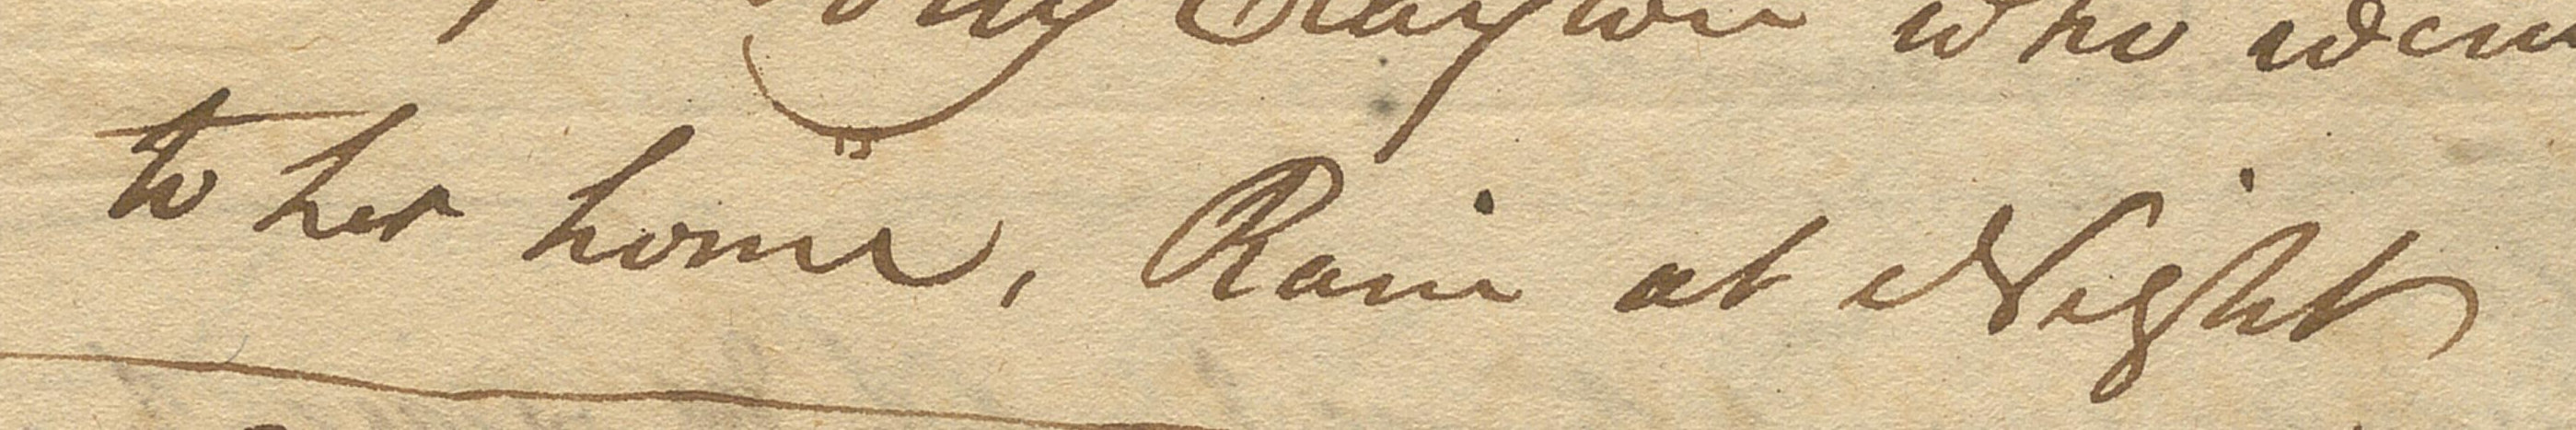to her home, Rain at Night
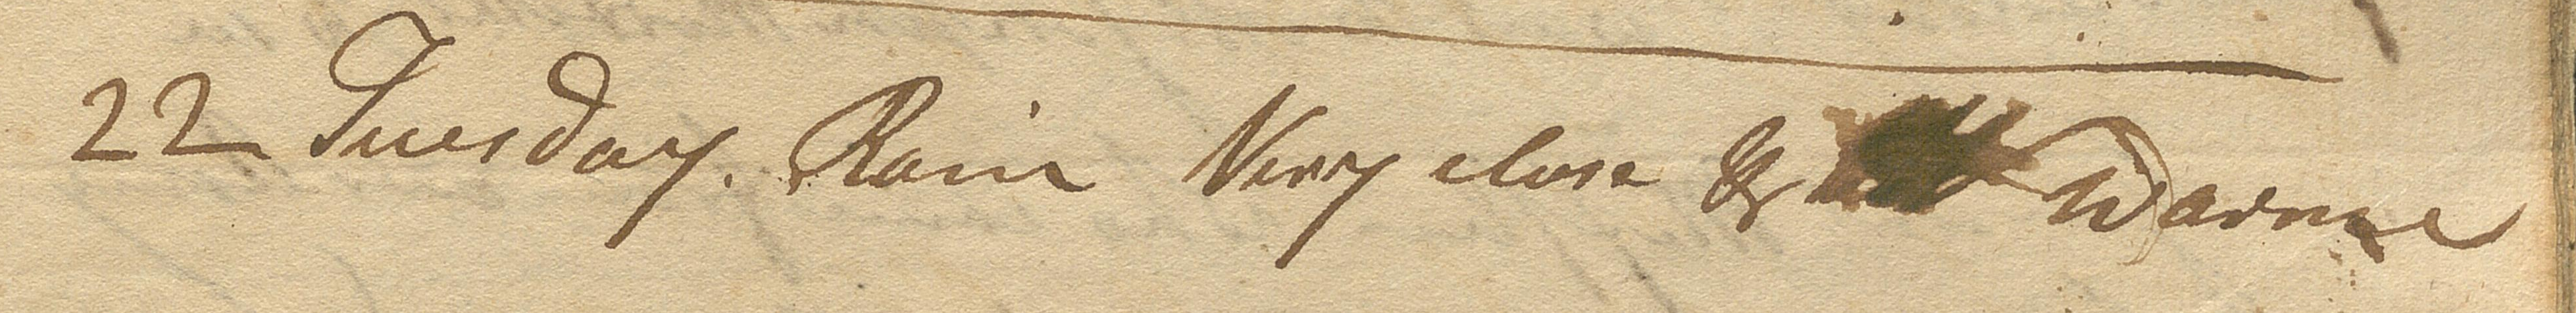22 Tuesday. Rain Very close & [__] Warme
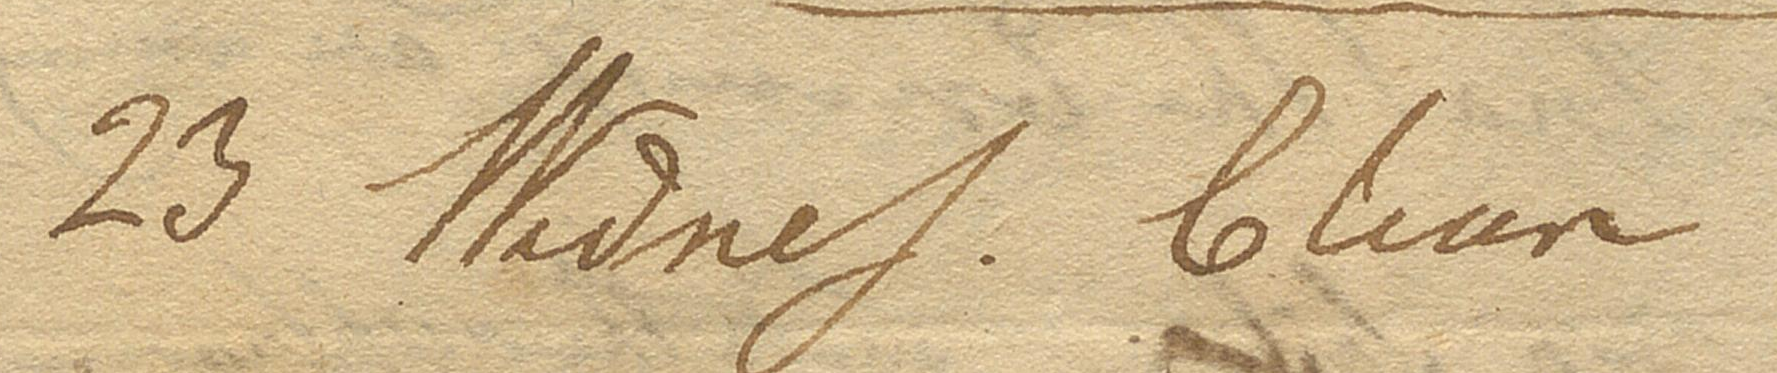23 Wednes. Clear
